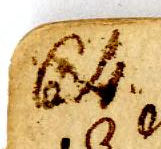64
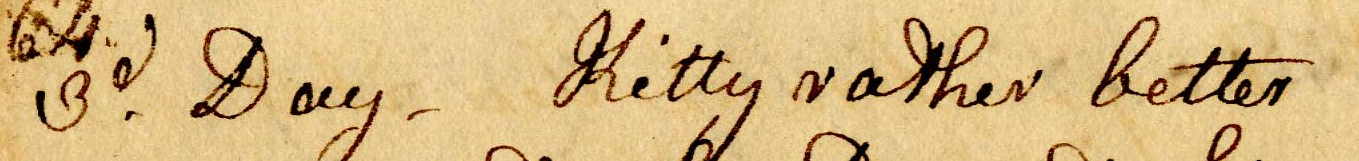3^d Day- Kitty rather better
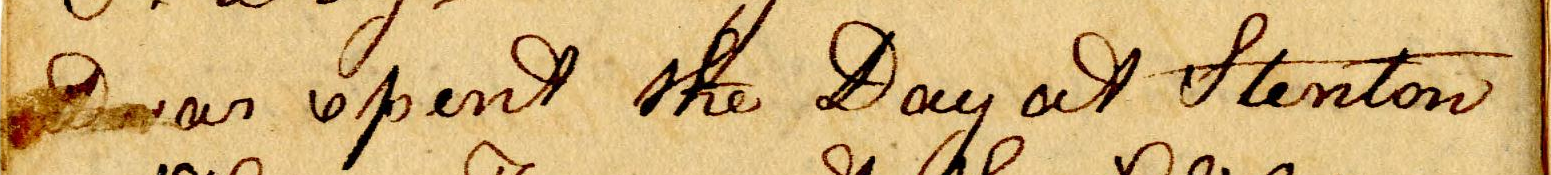Dran spent the Day at Stenton
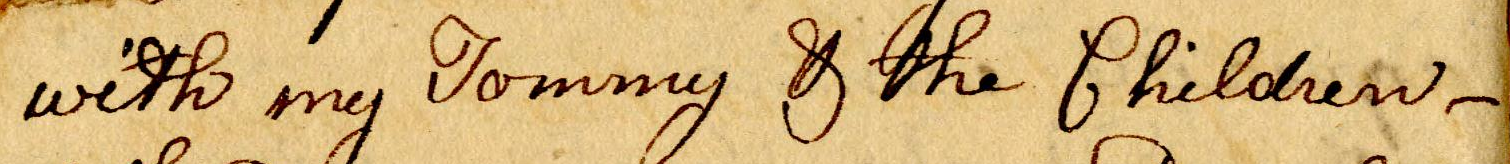with my Tommy & the Children-
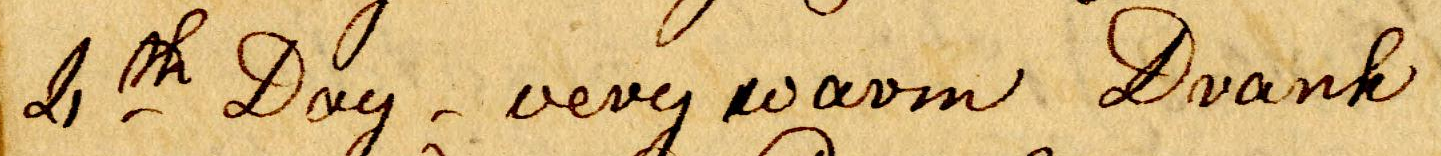4^th Day- very warm, Drank
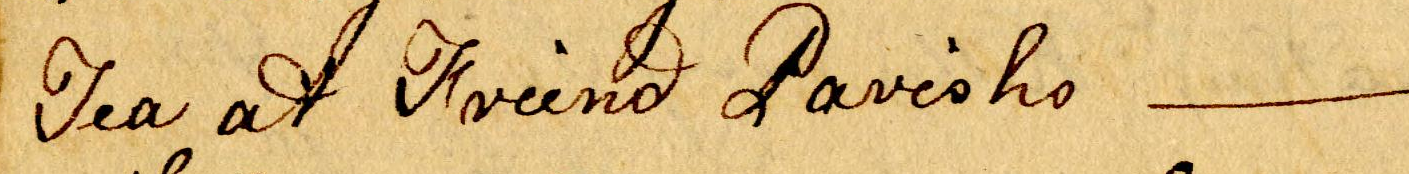Tea at Friend Parishs-
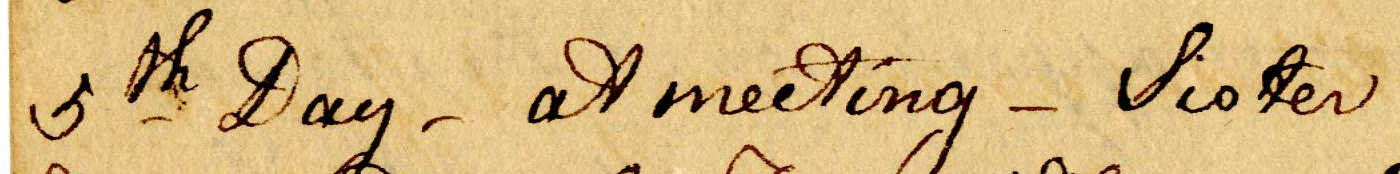5^th Day- at meeting- Sister
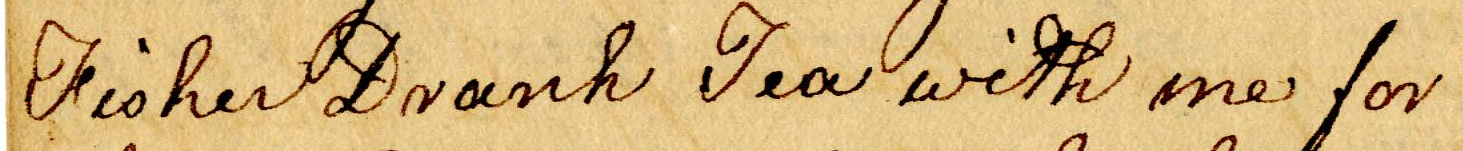Fisher Drank Tea with me for
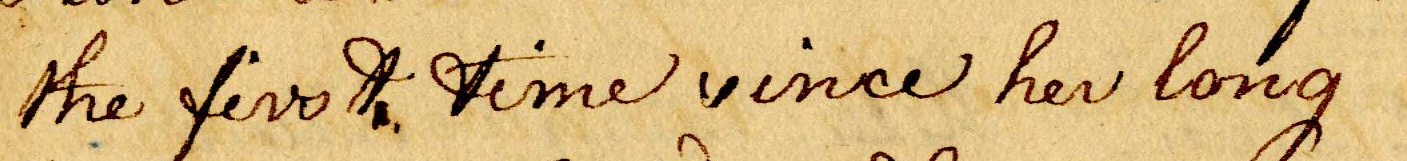the first time since her long
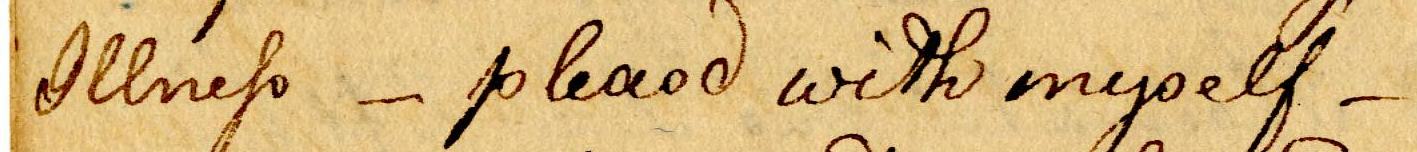Illness- pleasd with myself-
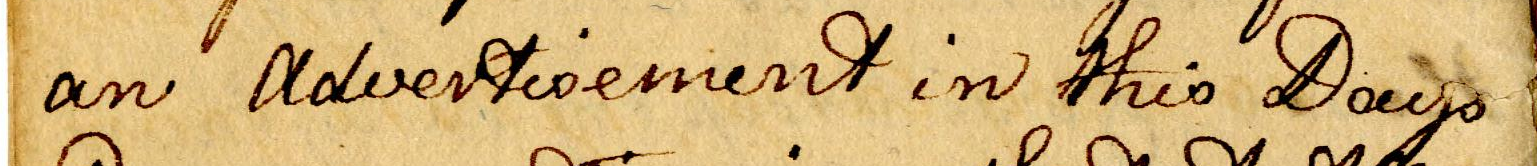an Advertisement in this Days
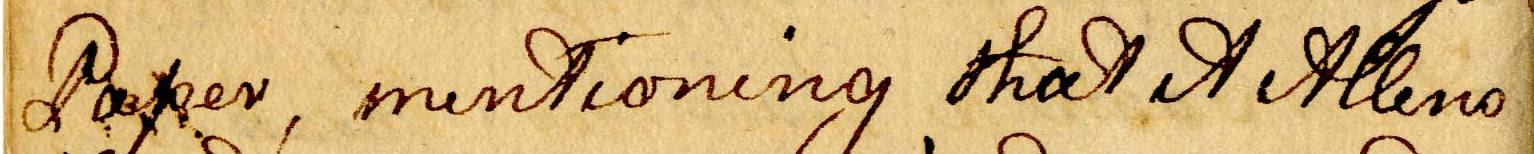Paper, mentioning that it Allens
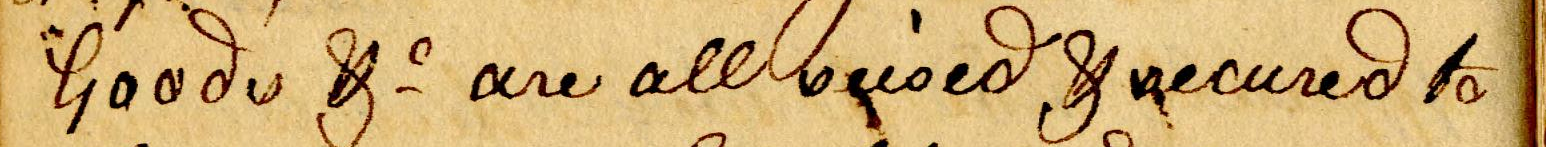Goods &^c are all seised & secured to
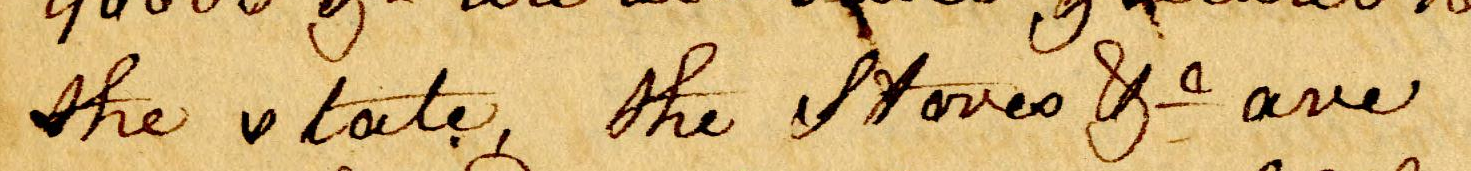the state, the Stores &^c are
